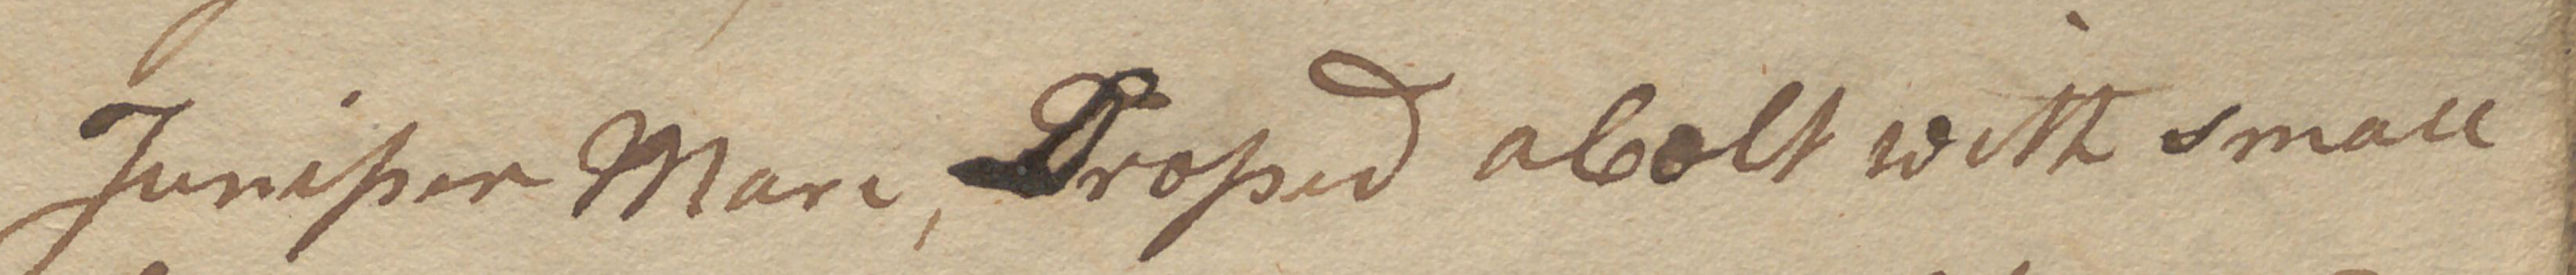Juniper Mare Droped a Colt with small
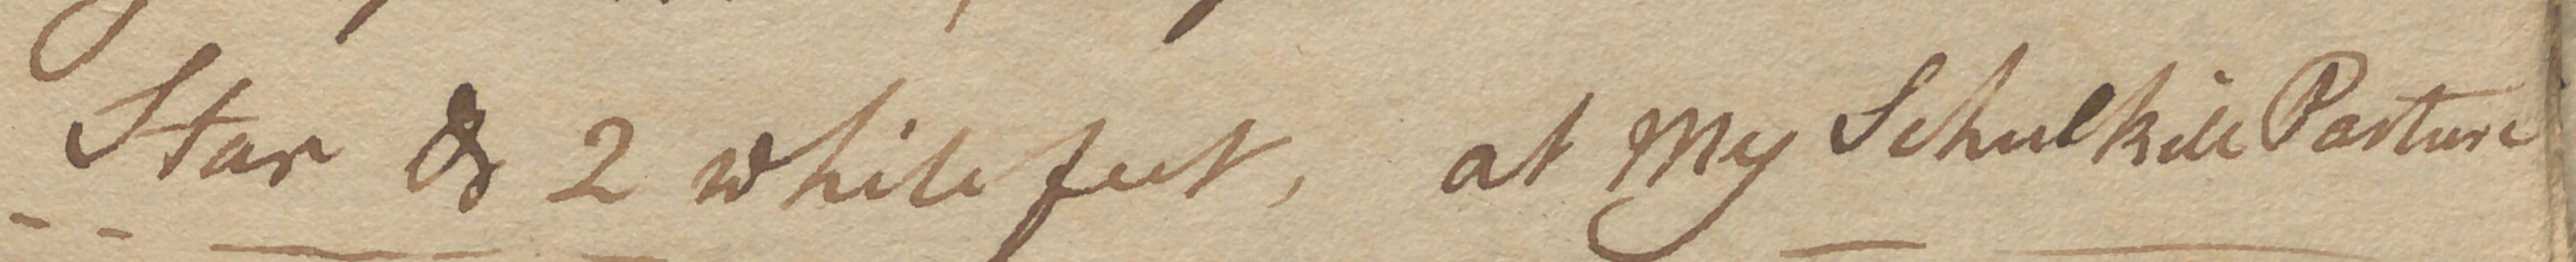Star & 2 white feet, at My Schulkill Pasture
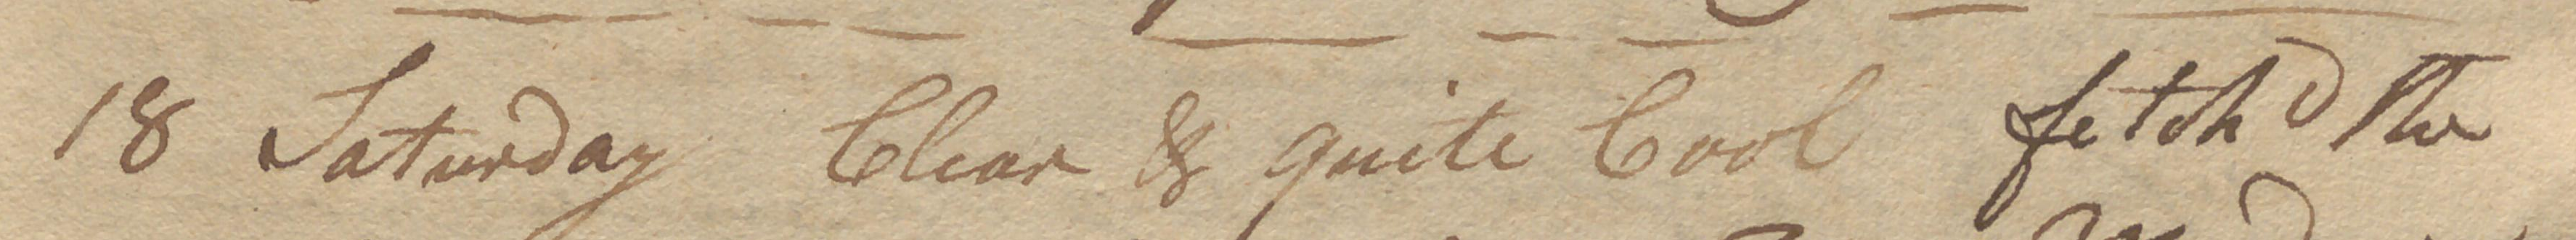18 Saturday Clear & quite Cool fetch^d the
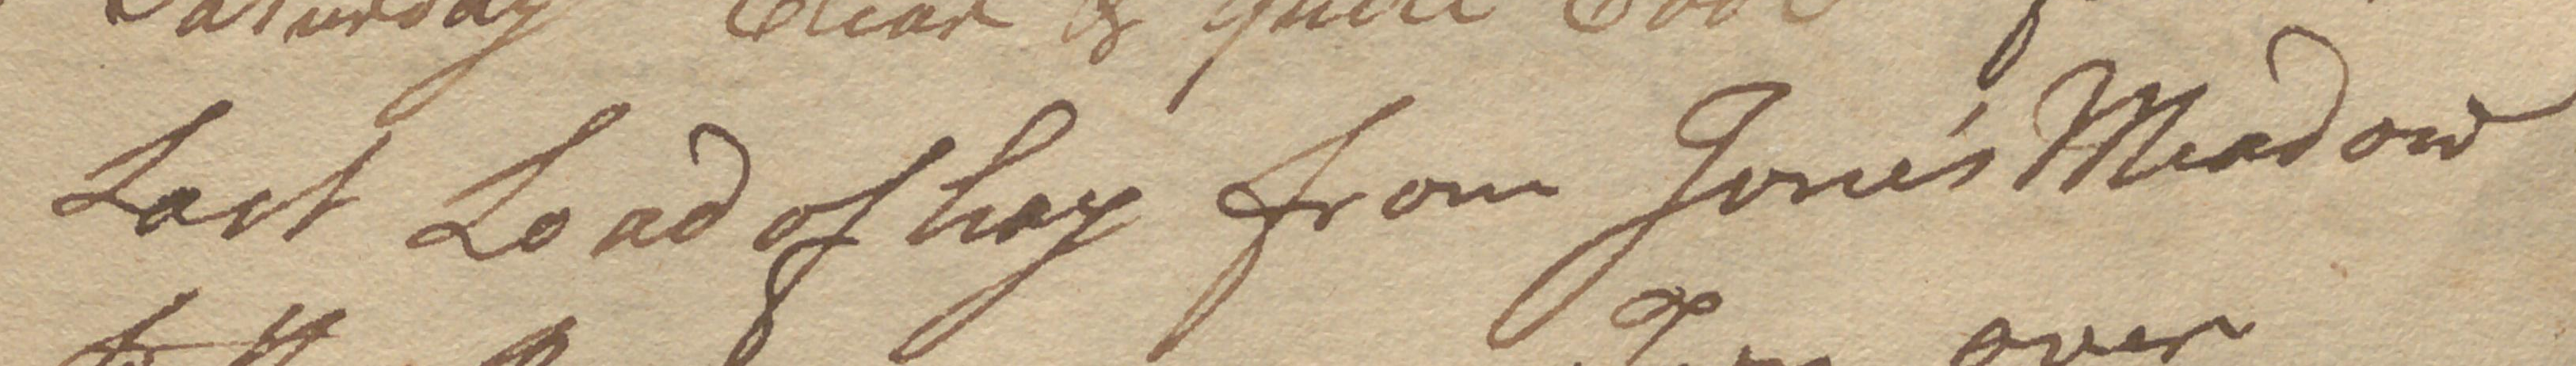Last Load of hay from Jone's Meadow
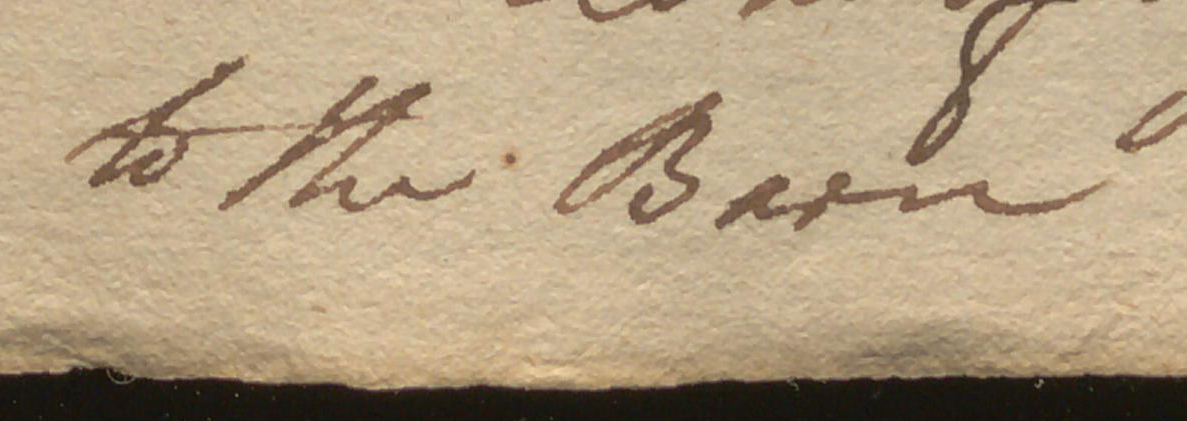to the Barn
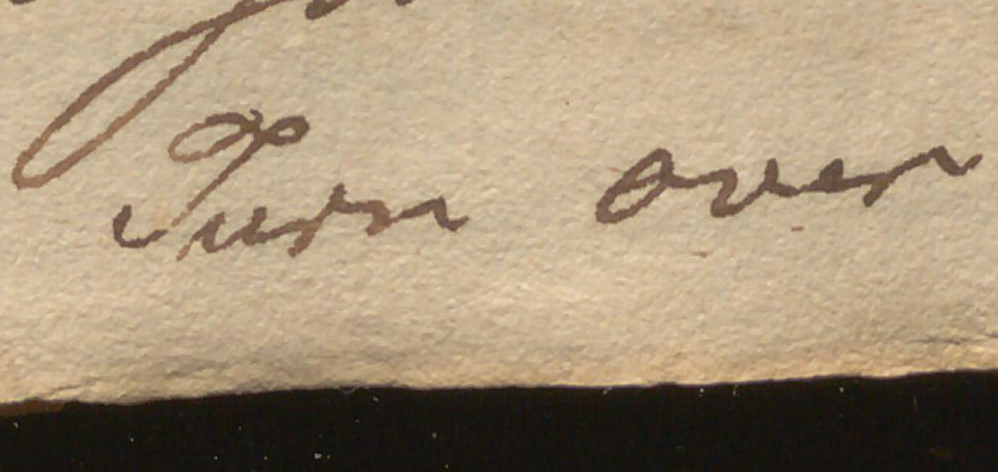Turn over
